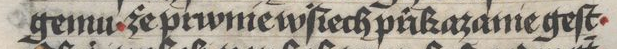gemu.że prwníe wẛiech pṙikazaníe geſt.
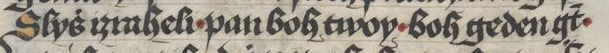Slyṡ izraheli.pan bóh twoy.boh geden ḡt.
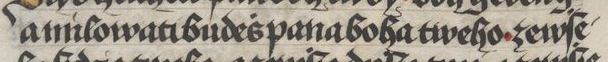a milowati budeṡ pana boha tweho.zewẛe¬
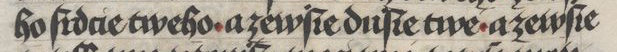ho ſrdcie tweho.a zewẛie duẛie twé.a zetwẛie
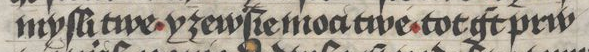myſli twe.y zewẛie moci twé.tot ḡt prw¬
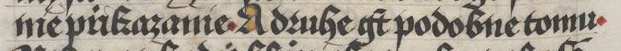né pṙikazanie.A druhe ḡt podobne tomu.
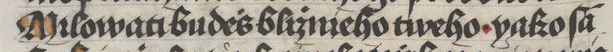Milowati budeṡ bliżníeho tweho.yako ſā
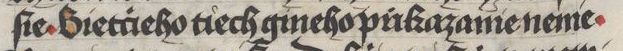ſie.Víetċieho tiech gineho pṙikazanie neníe.
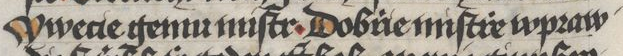Ywecie gemu míſtr.Dobṙíe miſtṙe wpraw¬
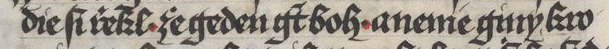díe ſi ṙekl.że geden ḡt boh.a neníie giny kro¬
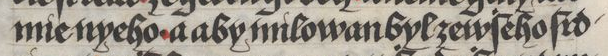mie nyeho.a aby milowan byl zewẛeho ſrd¬
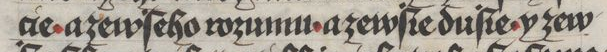cie.a zewẛeho rozumu.zewẛíe duẛie.y zew¬
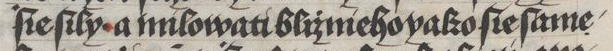ẛie ſily.a milowati bliżníeho yako ſie ſame¬
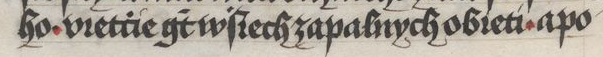ho.vietċíe ḡt wẛiech zapalnych obietí.a po
